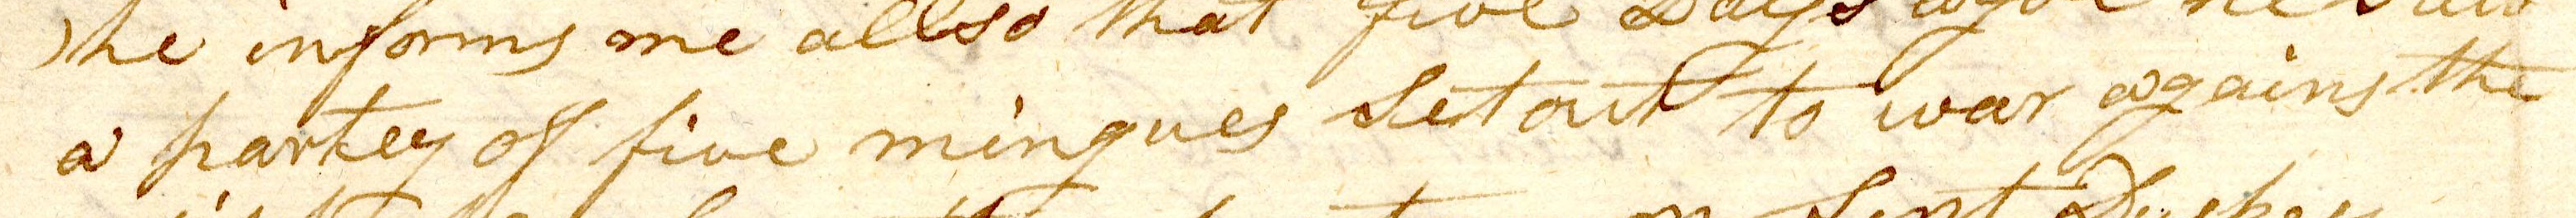a partey of five mingues set out to war agains the
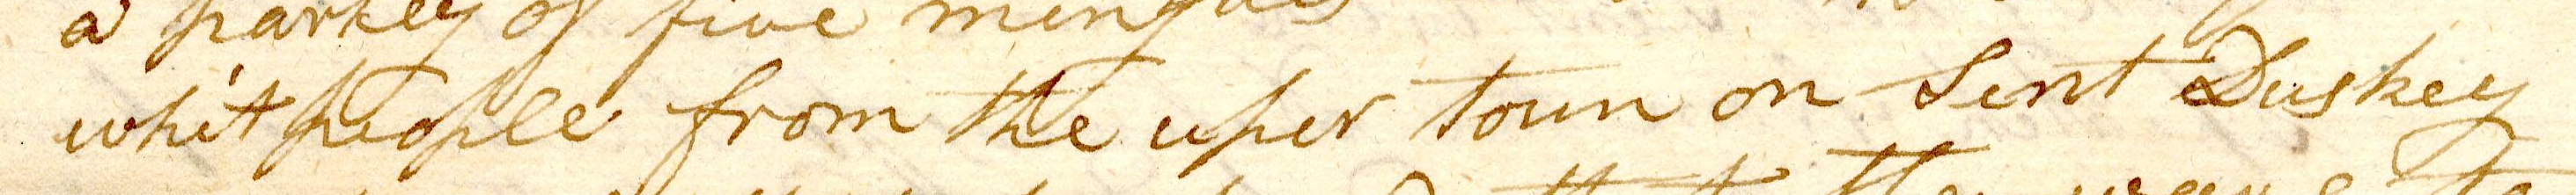whit people from the uper toun on Sent Duskey
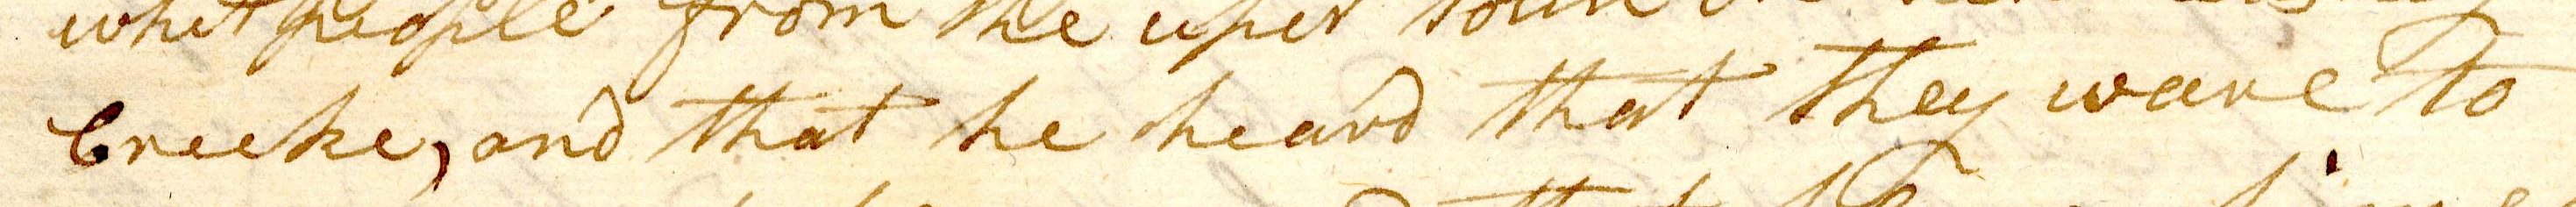Creeke, and that he heard that they ware to
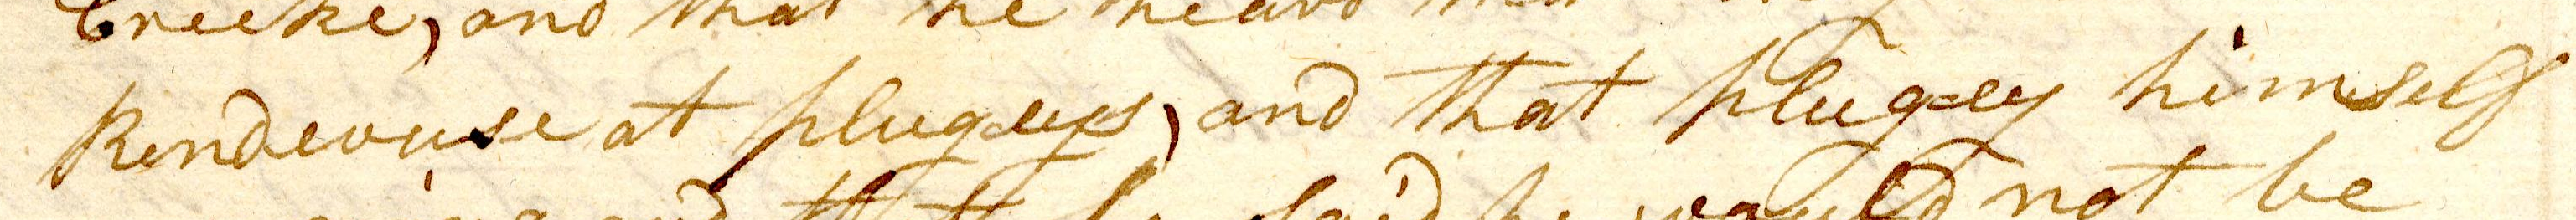Rendevuse at plugeys, and that plugey himself
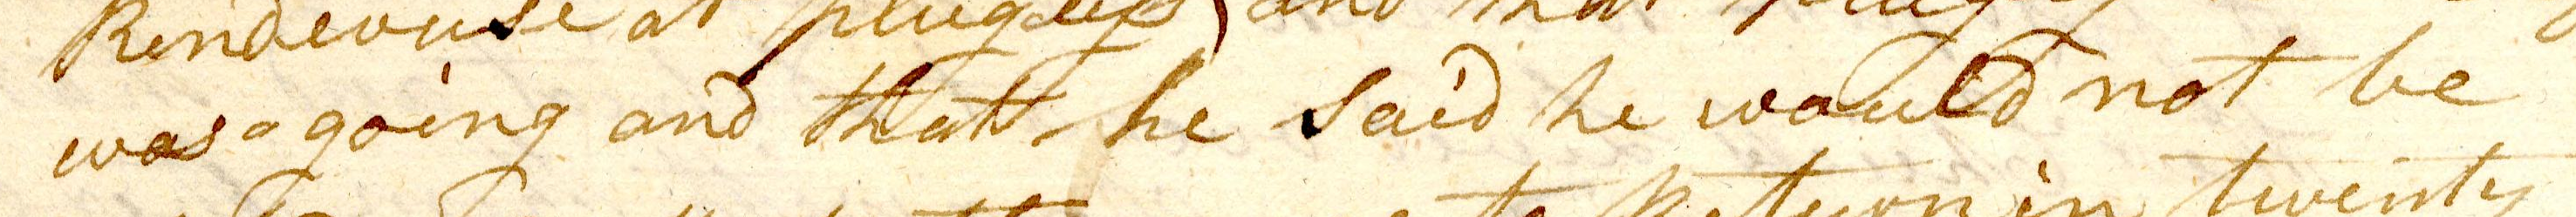was a going and that, he said he would not be
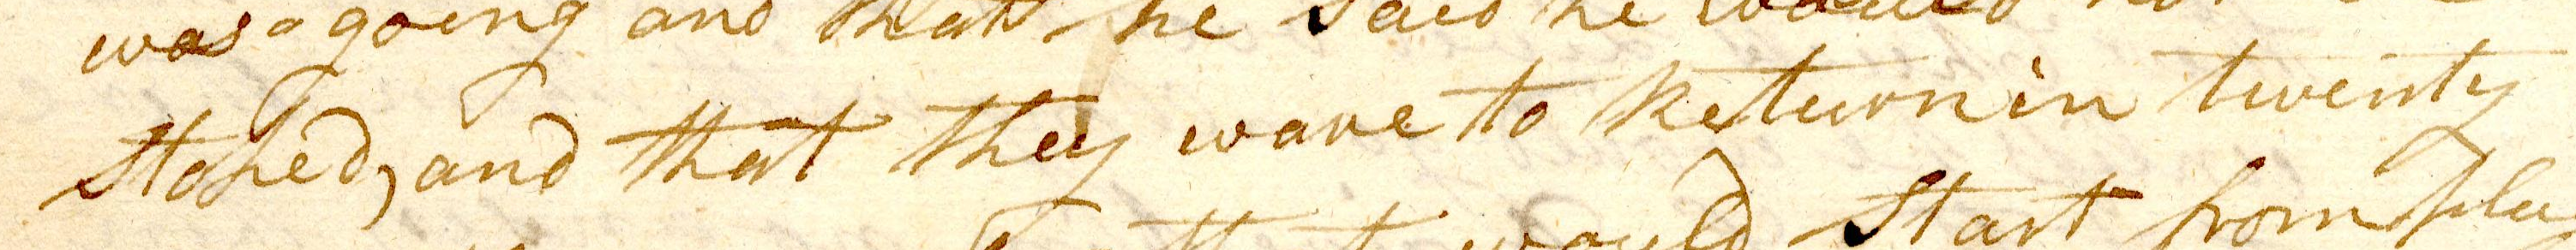stoped, and that they ware to Return in twenty
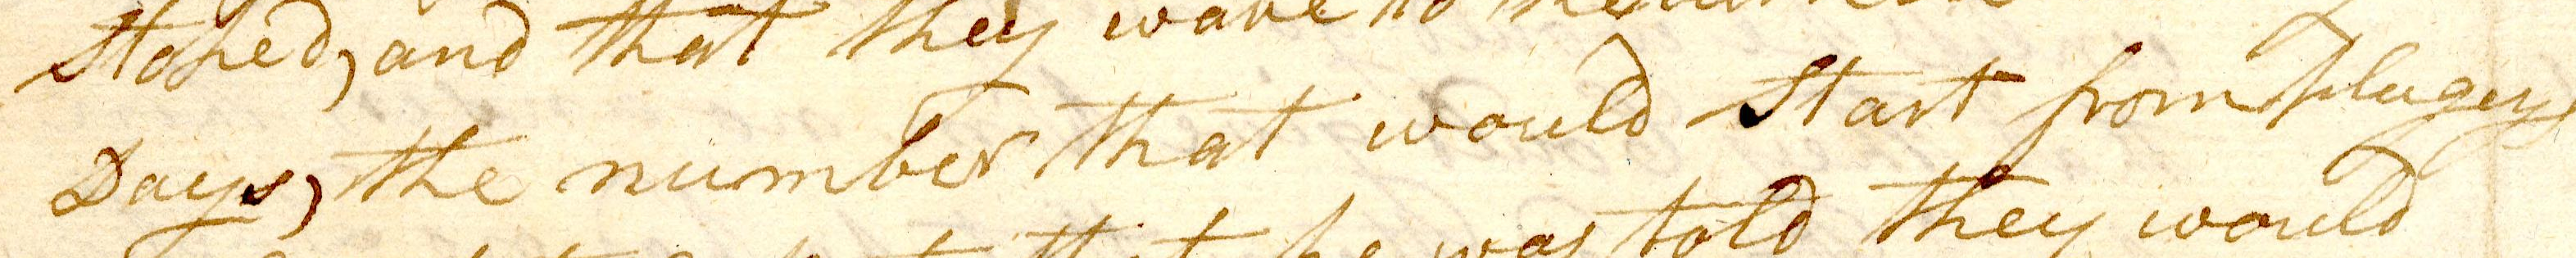Days, the number that would Start from plugey
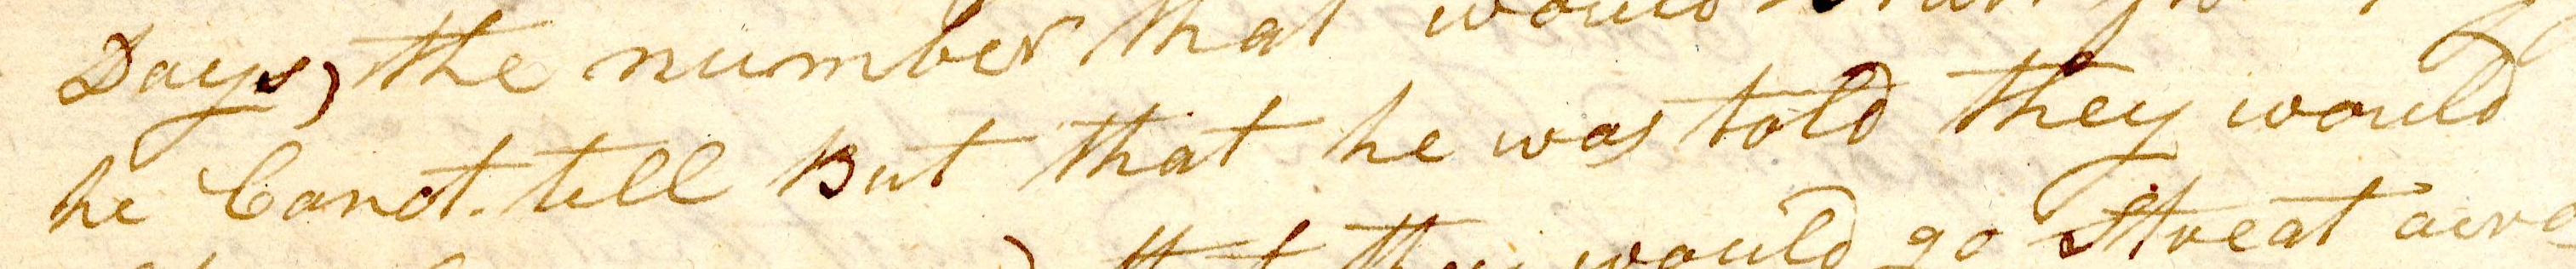he Canot tell But that he was told they would
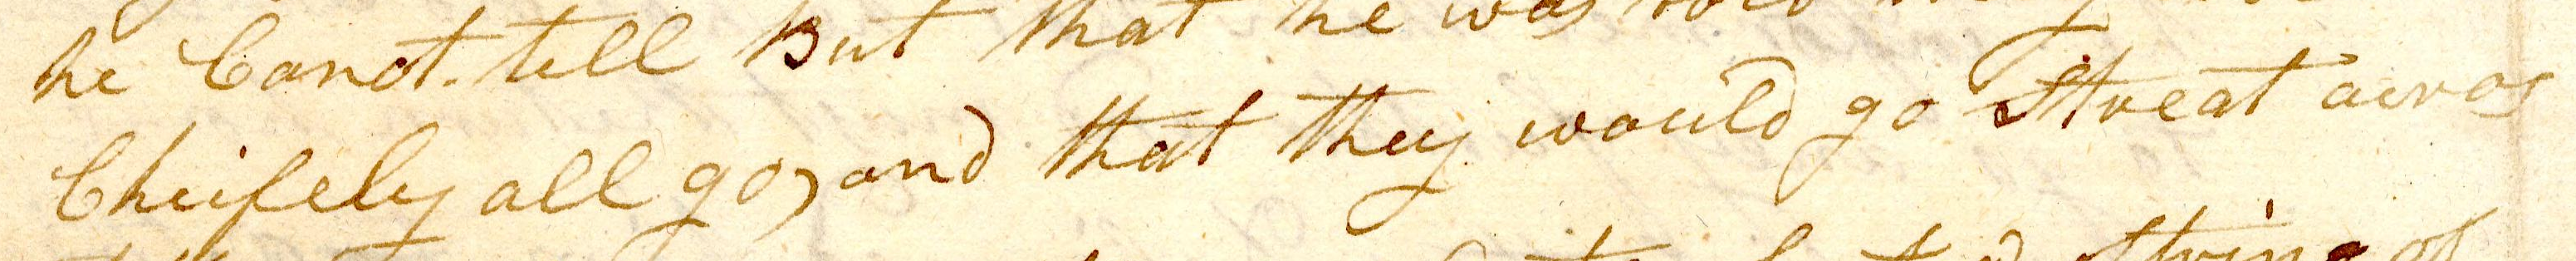Chiefely all go, and that they would go streat acros
